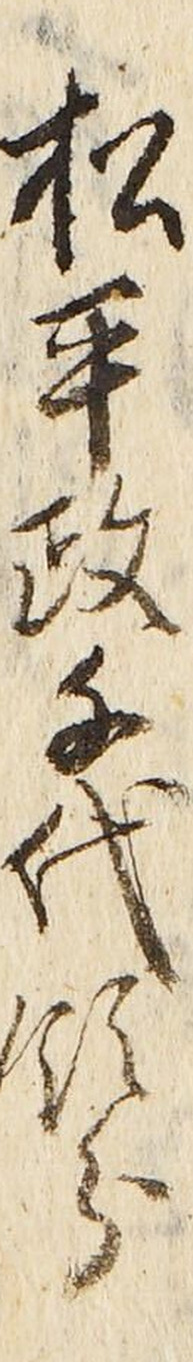松平政千代領分
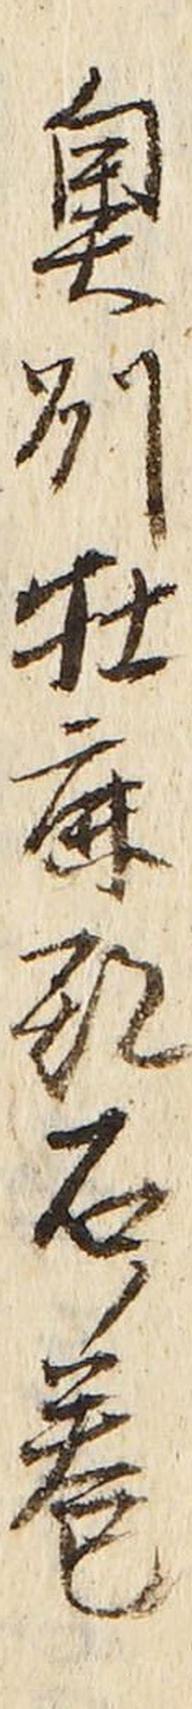奥州牡鹿郡石ノ巻
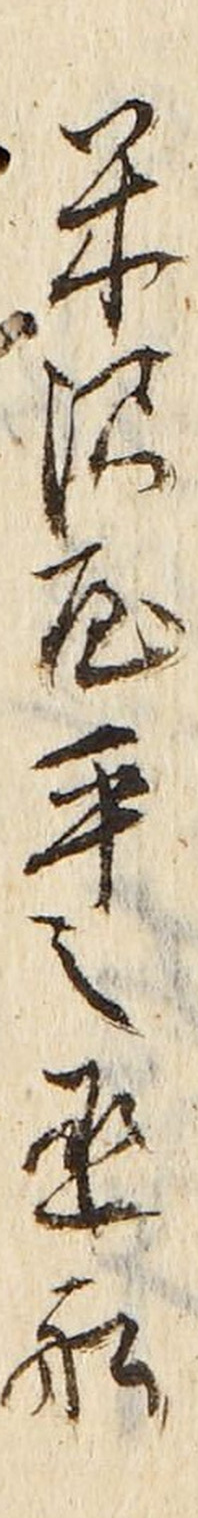米沢屋平之丞船
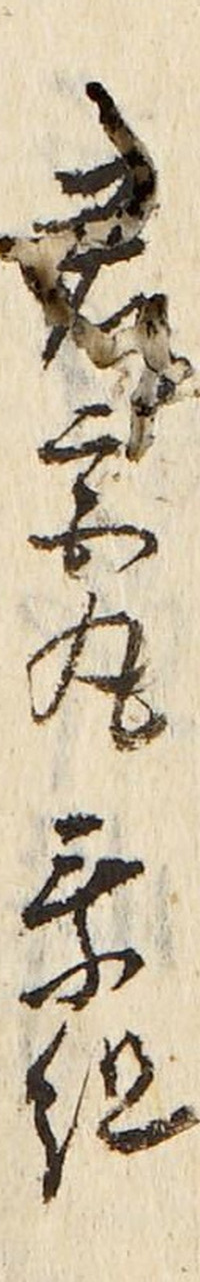若宮丸乗組
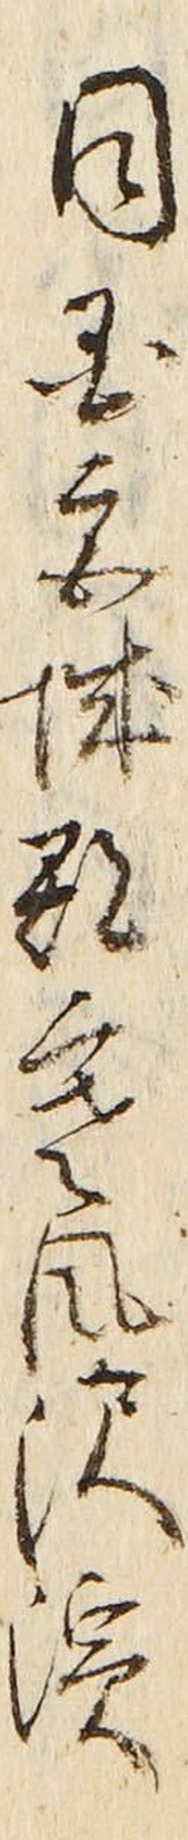同国宮城郡寒風沢浜
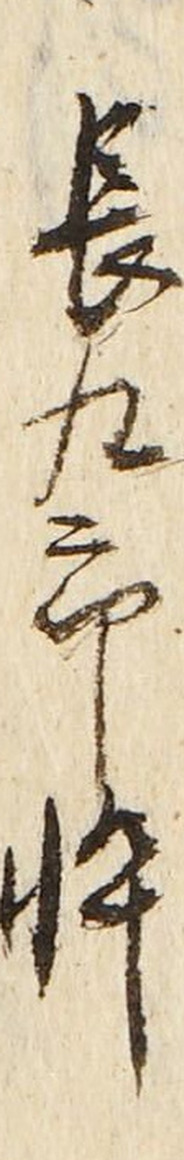長九郎悴
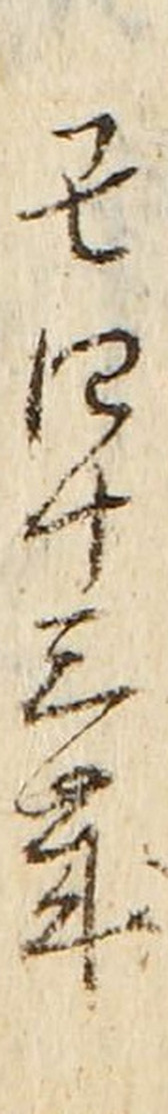丑四十三歳
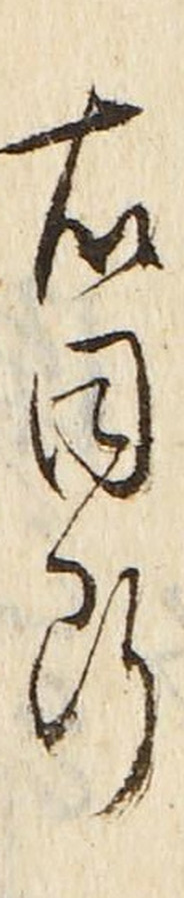右同断
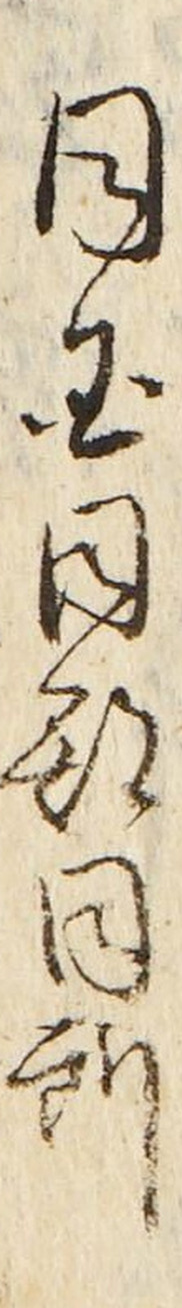同国同郡同所
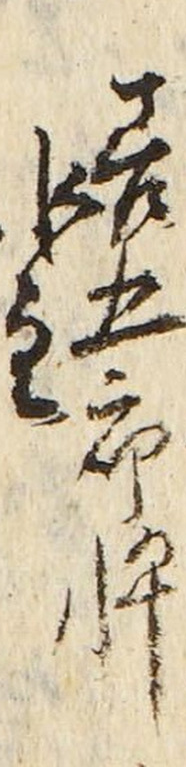善五郎悴
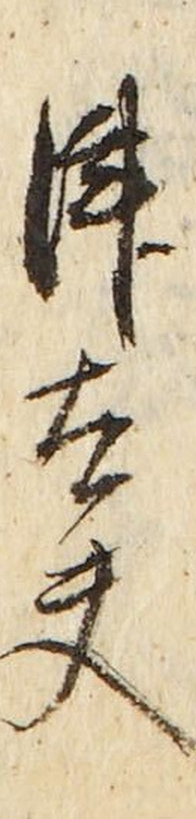津太夫
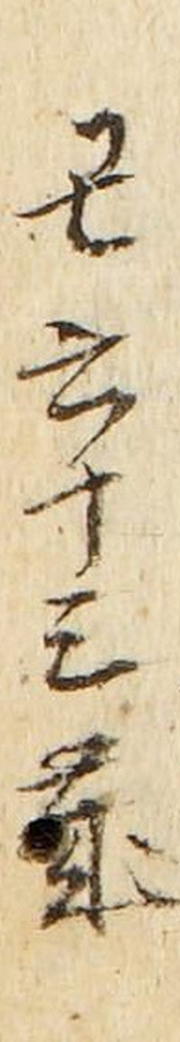丑六十三歳

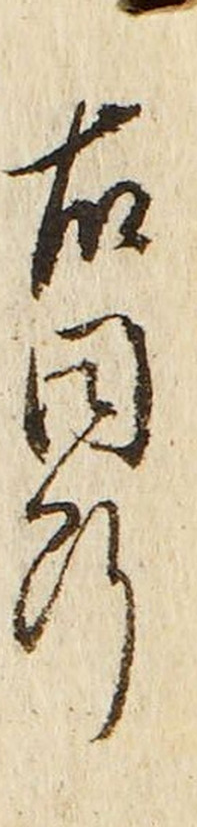右同断
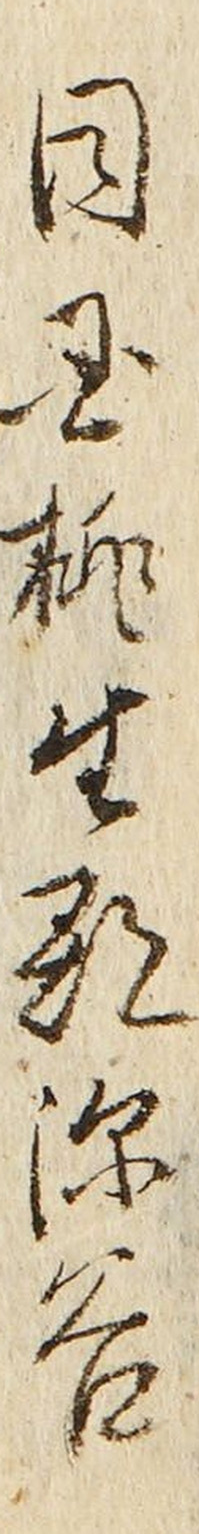同国桃生郡深谷
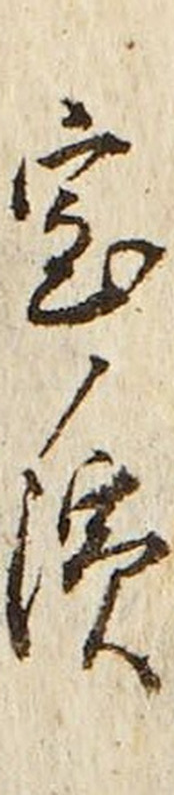室ノ浜
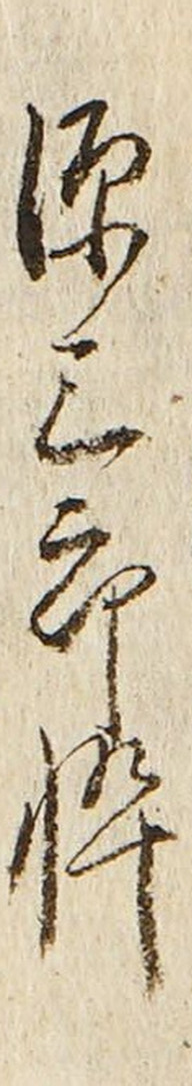源三郎悴
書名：漂民後記
